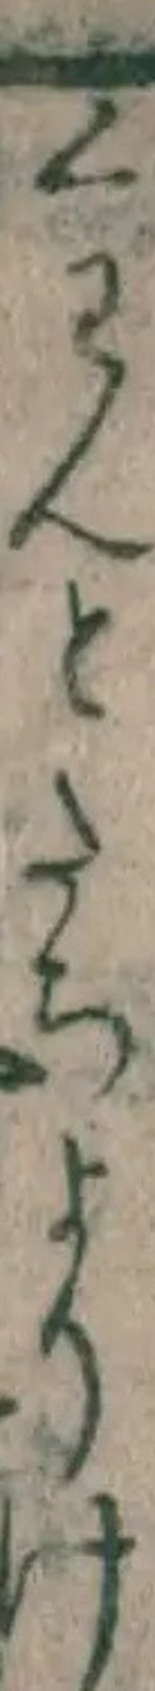くわんとたちよりける
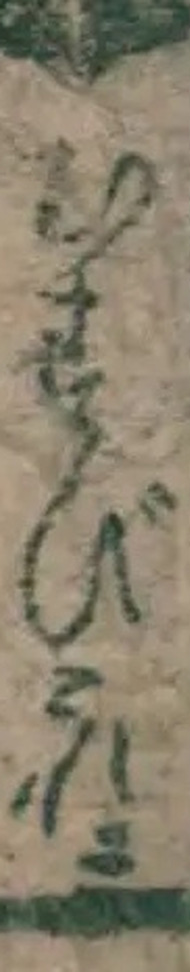むすびこれに
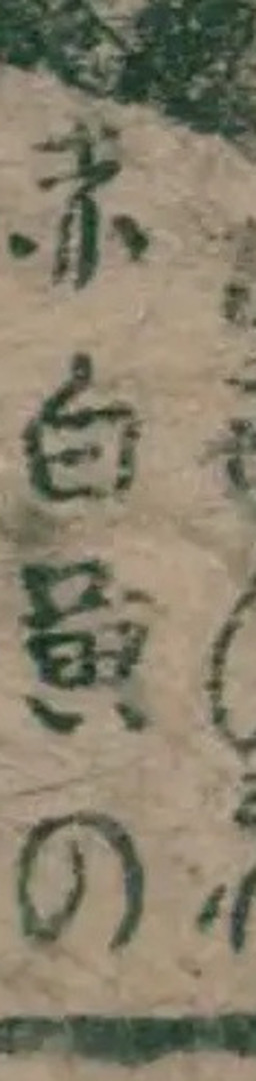赤白黄の
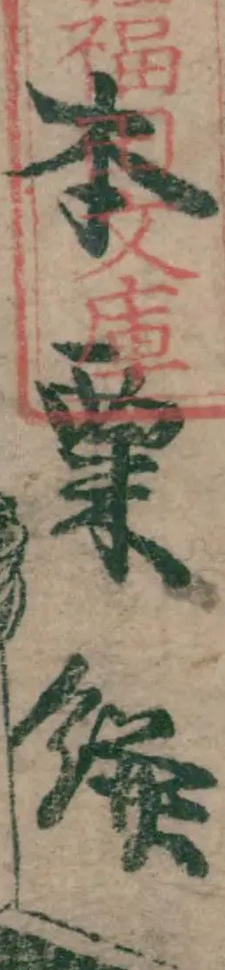本粟餅
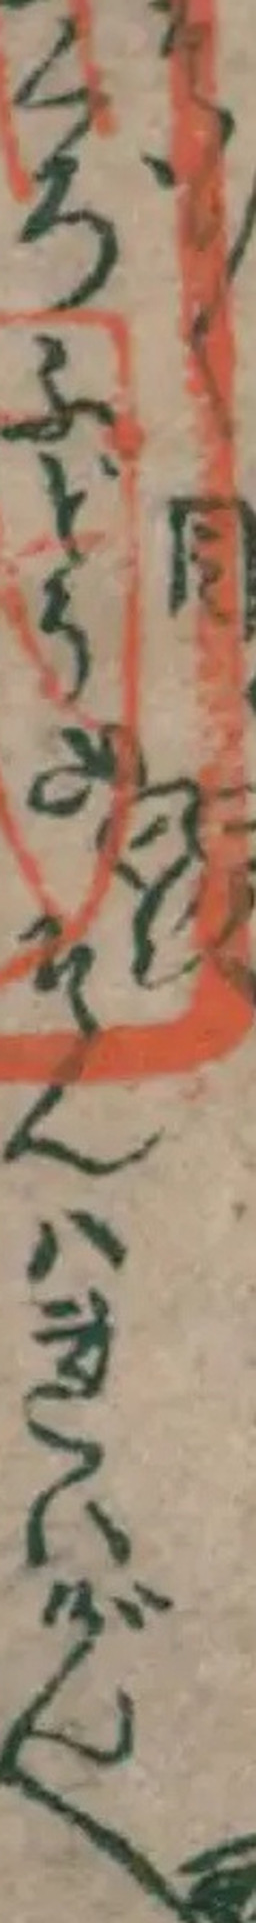くろふどうそんはれいがん
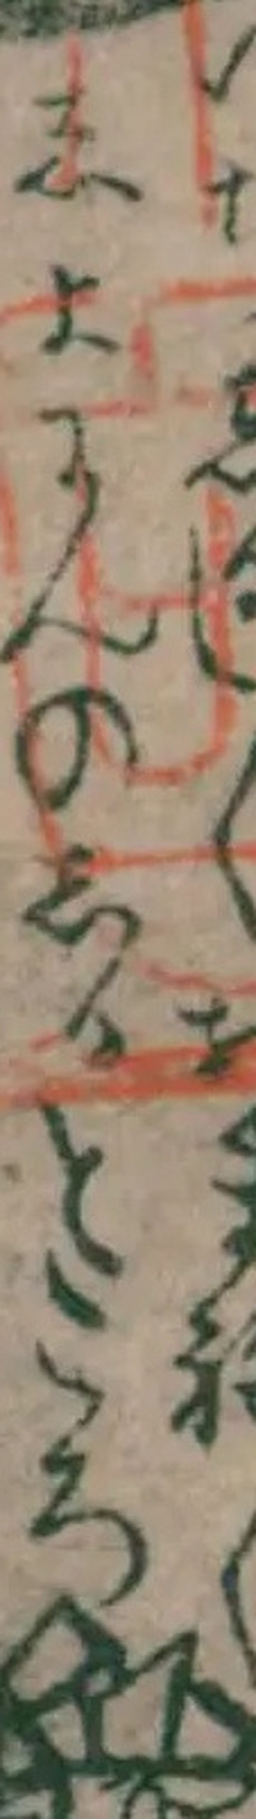しよにんのしるところ
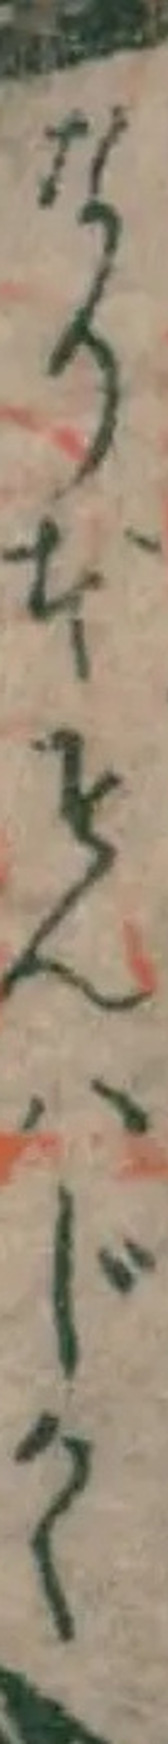なり本そんはじかく
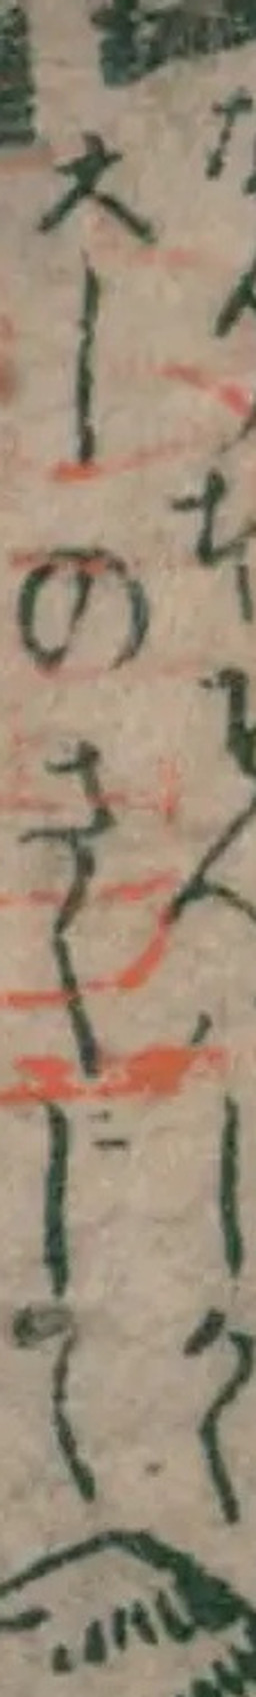大しのさくにして
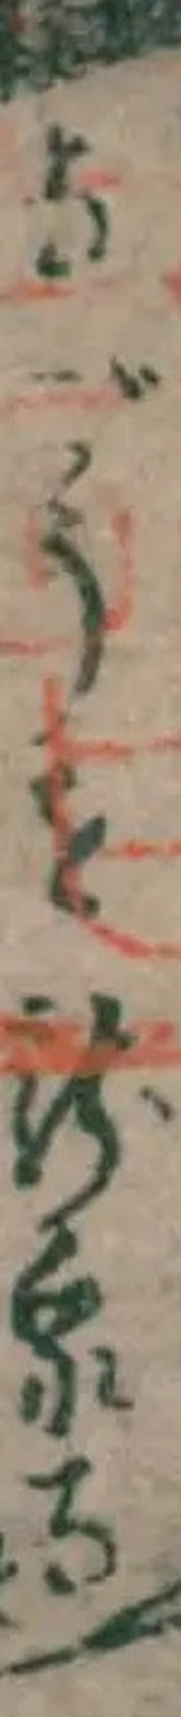寺ごうを龍泉寺と
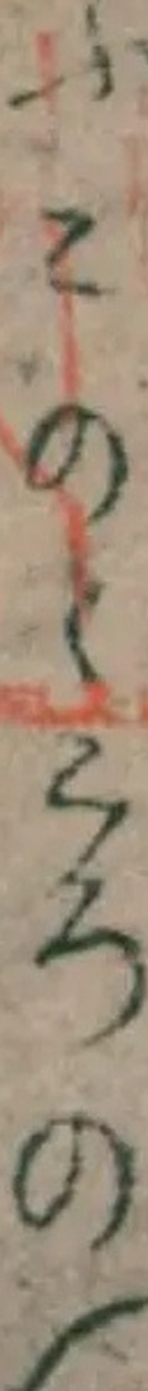いふこのところの
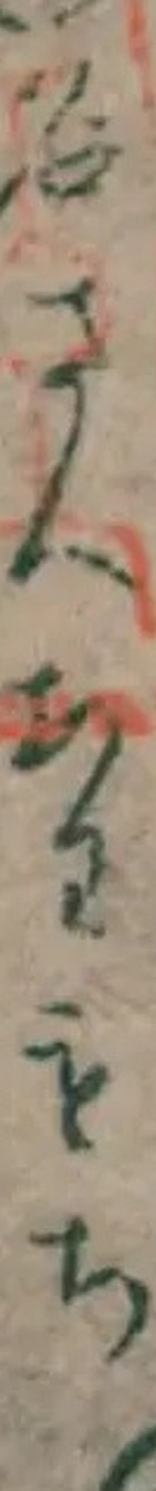目さんあわもち
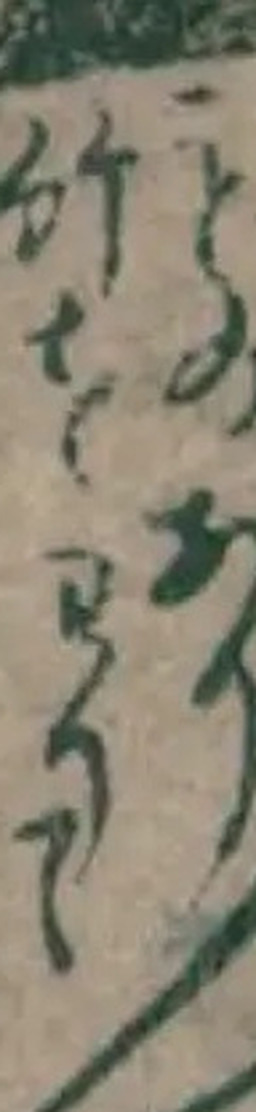竹をわりて
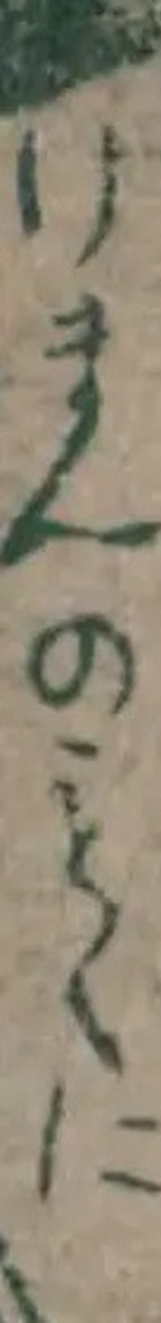けまんのことくに

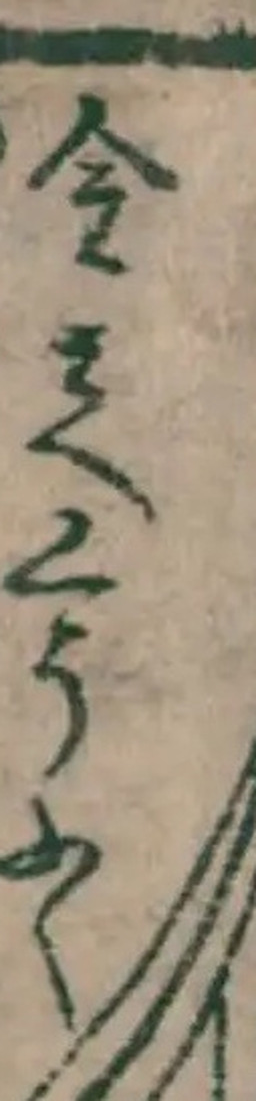金兵へくうふく
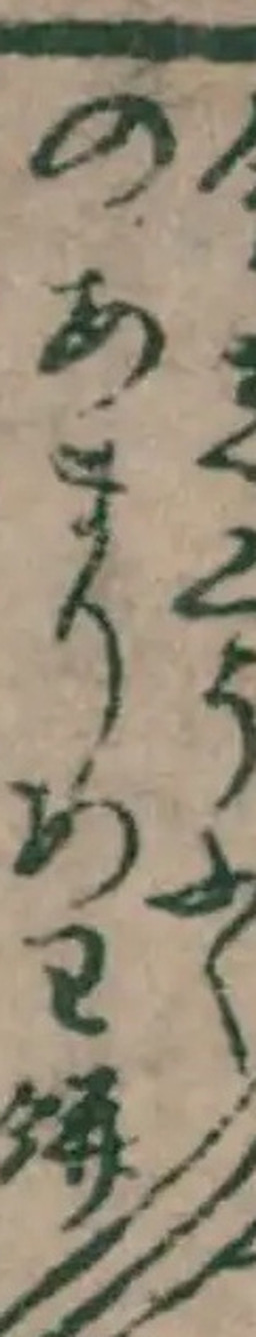のあまりあわ餅
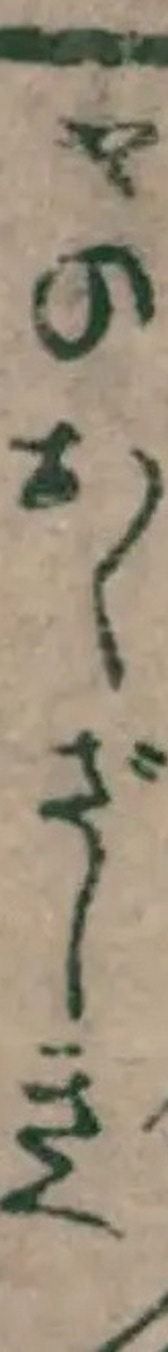やのおくざしきへ
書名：金々先生栄花夢 : 2巻
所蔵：国立国会図書館 National Diet Library, JAPAN
